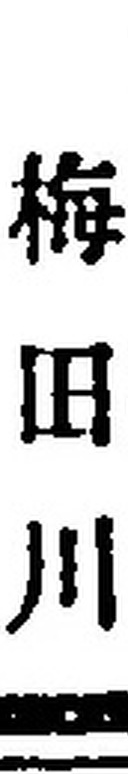梅田川
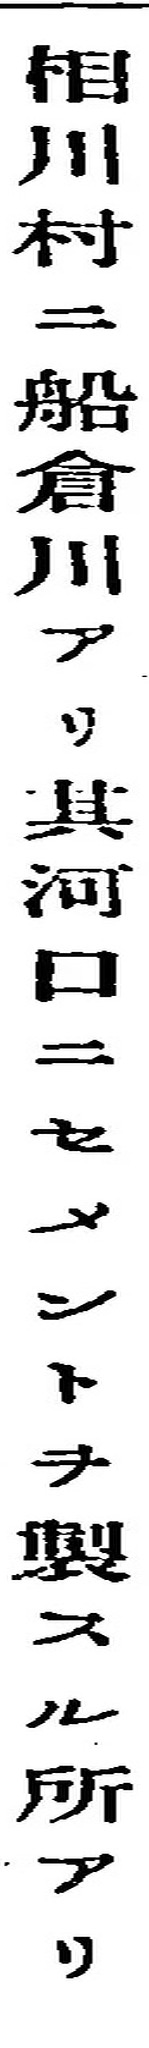相川村相川村ニ船倉川アリ其河口ニセメント製スル所アリ
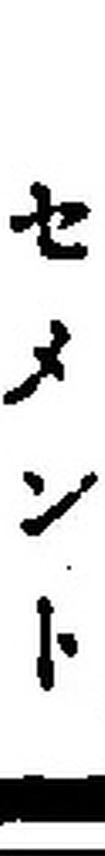セメント
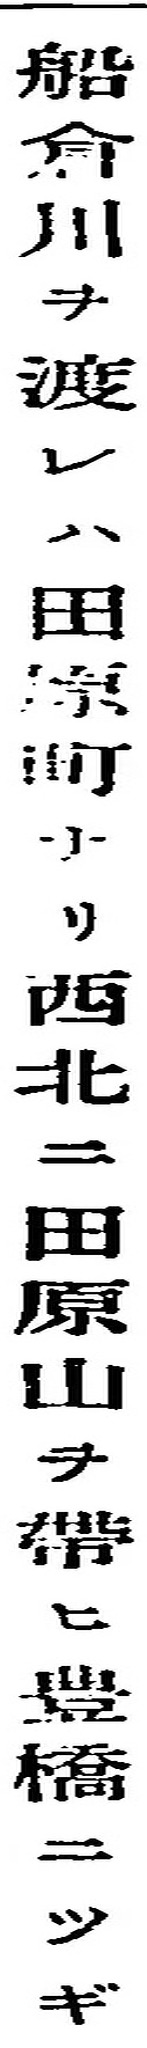田原町船倉川ヲ渡レハ田原町ナリ西北ニ田原山ヲ帶ヒ豊橋ニツギ
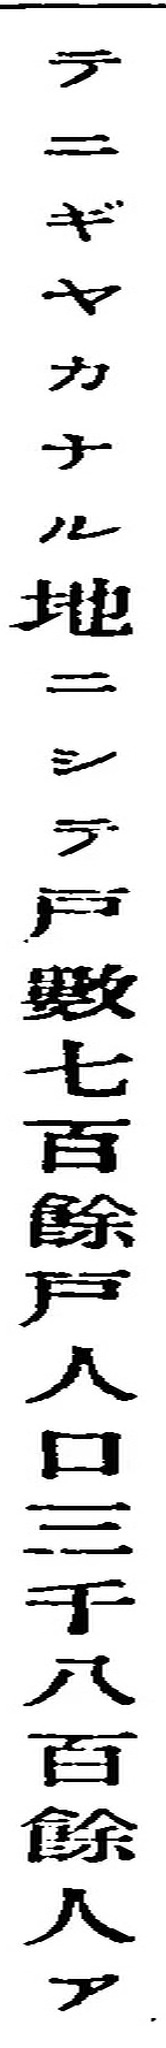テニギヤカナル地ニシテ戸數七百餘戸人口三千八百餘人ア
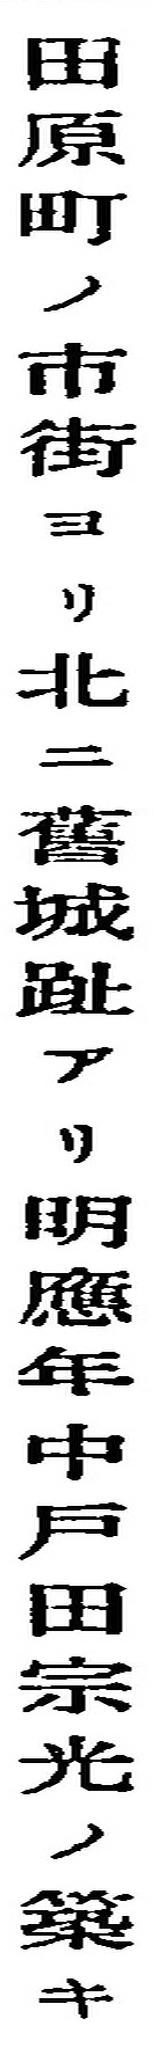田原城趾田原町ノ市街ヨリ北ニ舊城趾アリ明應年中戸田宗光ノ築キ
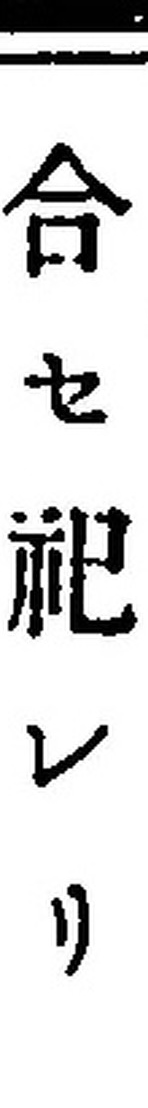合セ祀レリ
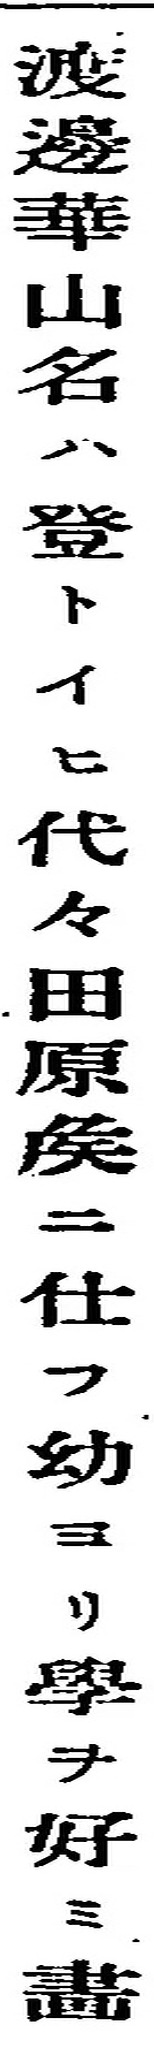渡邊華山渡邊華山名ハ登トイヒ代々田原矦ニ仕フ幼ヨリ學ヲ好ミ畵
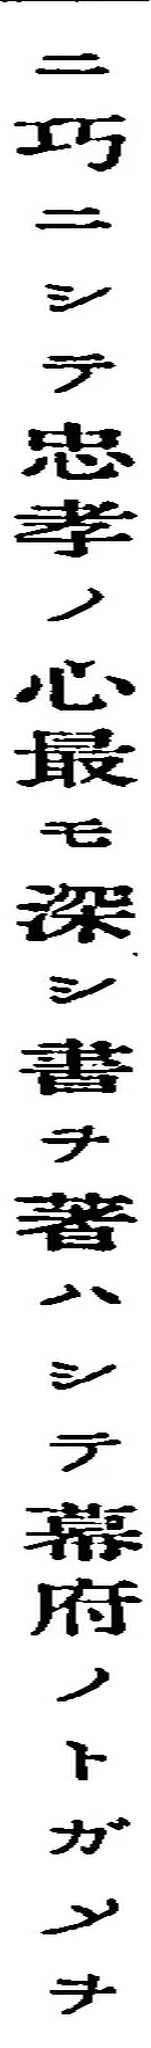ニ巧ニシテ忠孝ノ心最モ深シ書ヲ著ハシテ幕府ノトガメヲ
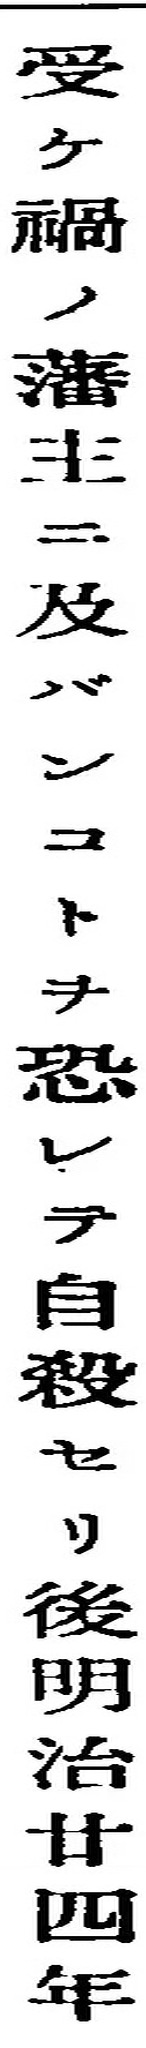受ケ禍ノ藩主ニ及バンコトヲ恐レテ自殺セリ後明治廿四年
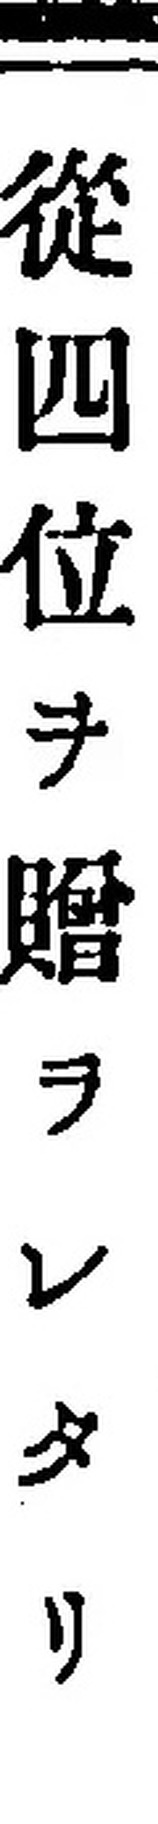從四位ヲ贈ラレタリ
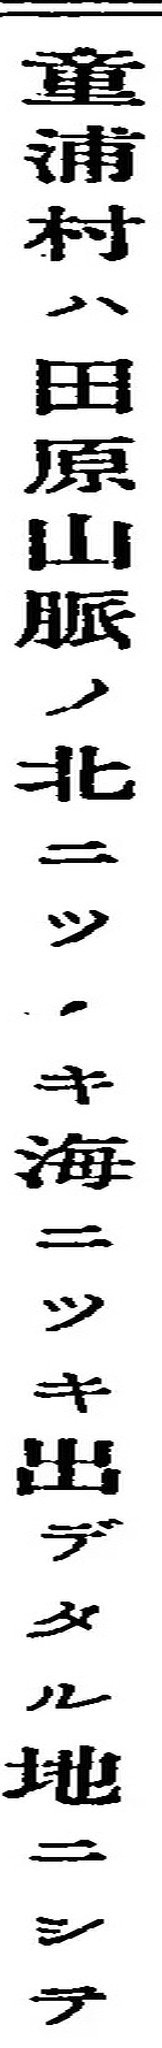童浦村童浦村ハ田原山脈ノ北ニツヽキ海ニツキ出デタル地ニシテ
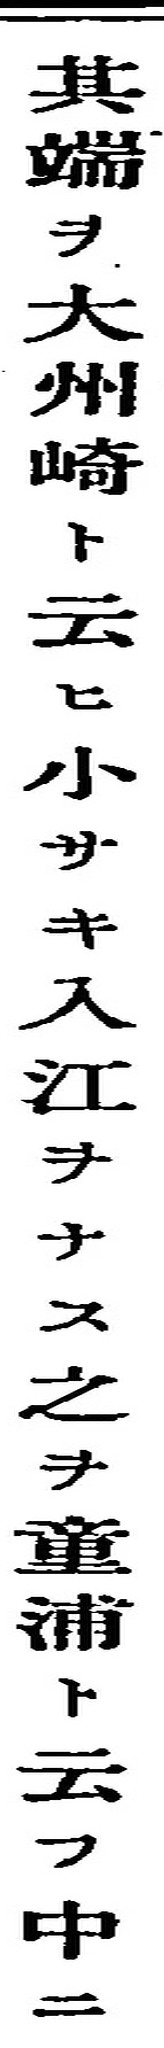童ノ浦其端ヲ大州崎ト云ヒ小サキ入江ヲナス之ヲ童浦ト云フ中ニ
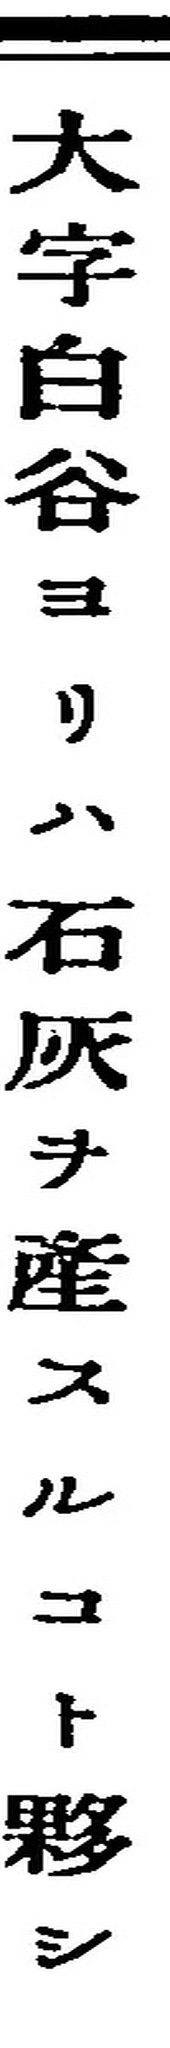產物大字白谷ヨリハ石灰ヲ產スルコト夥シ
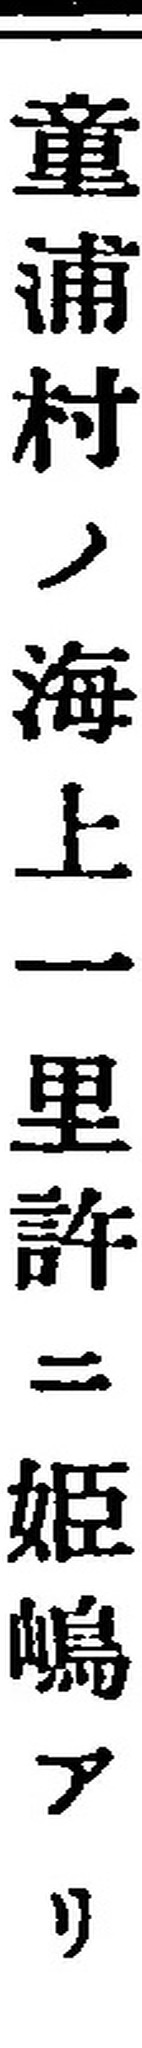姫島童浦村ノ海上一里許ニ姫嶋アリ
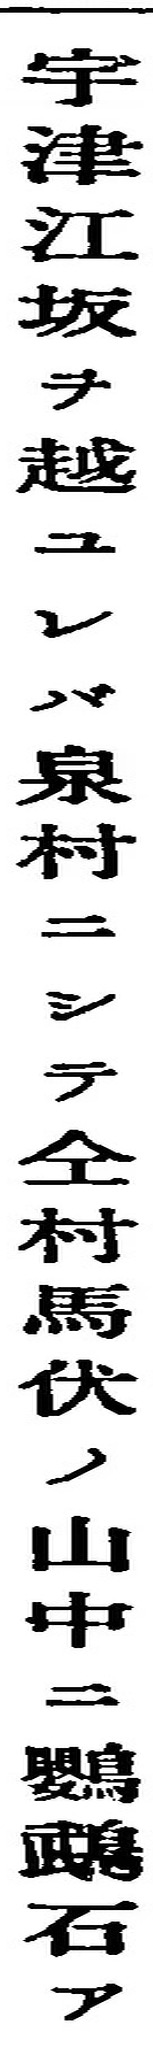泉村宇津江坂ヲ越ユレバ泉村ニシテ仝村馬伏ノ山中ニ鸚鵡石ア
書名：郷土誌
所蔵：国立国会図書館 National Diet Library, JAPAN
